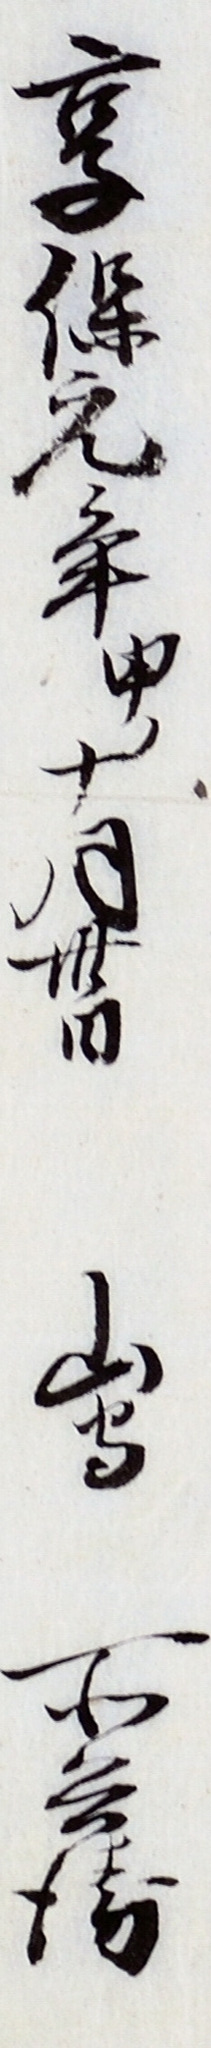享保元年甲ノ十月丗日山守所兵衛
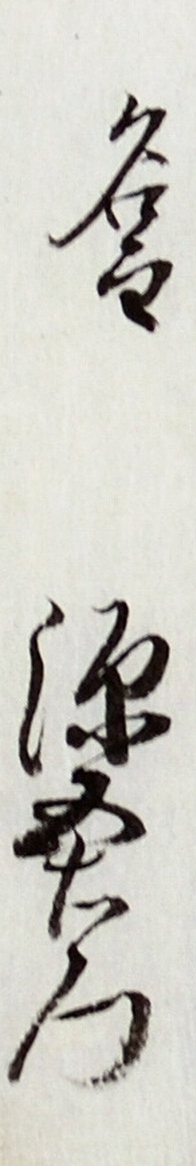名主源五右衛門
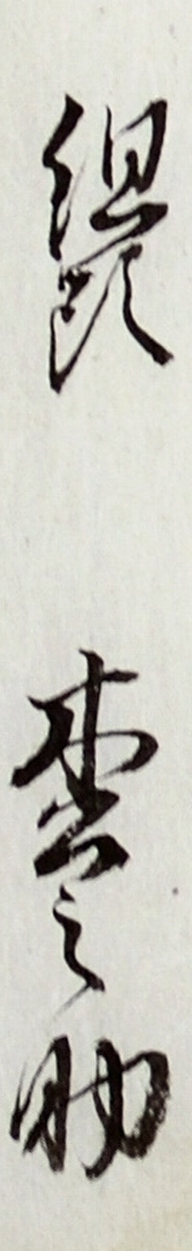組頭杢之助

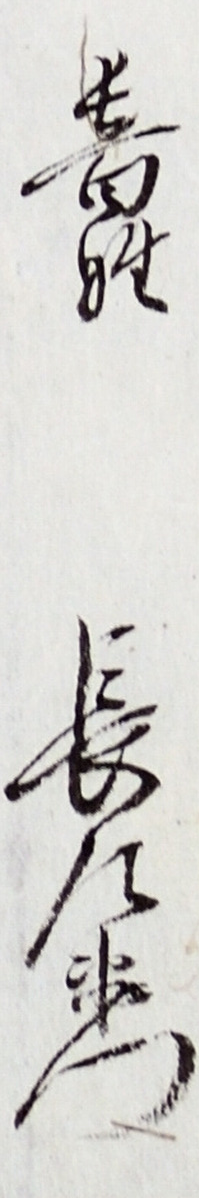長百姓長左衛門
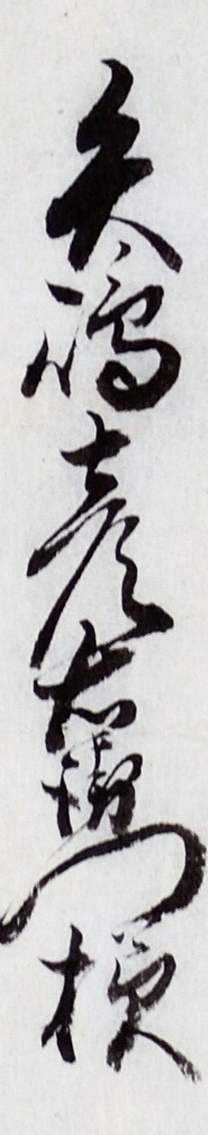矢嶋彦右衛門様
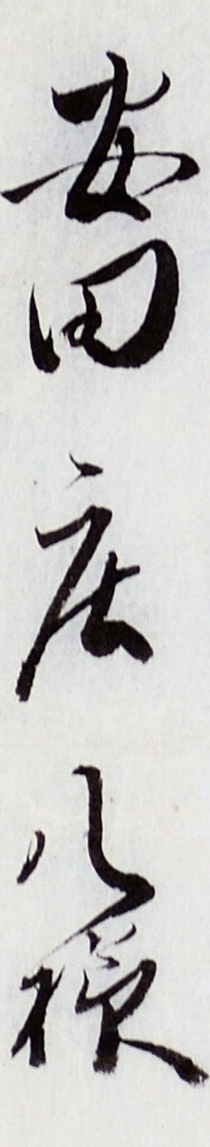安田庄八様
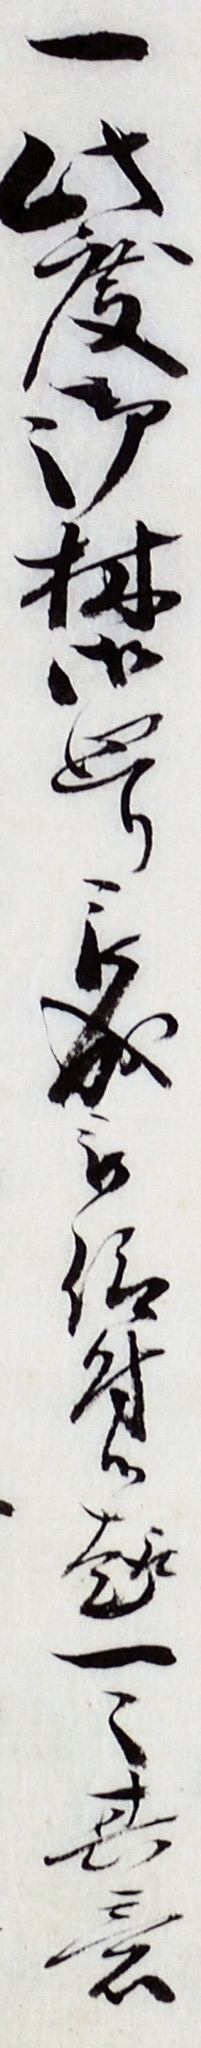一此度御林御廻り被成被仰付候趣一々其意
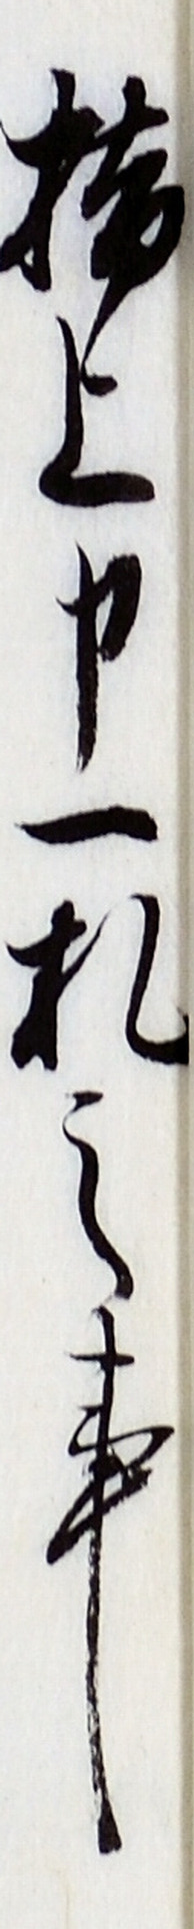指上申一札之事
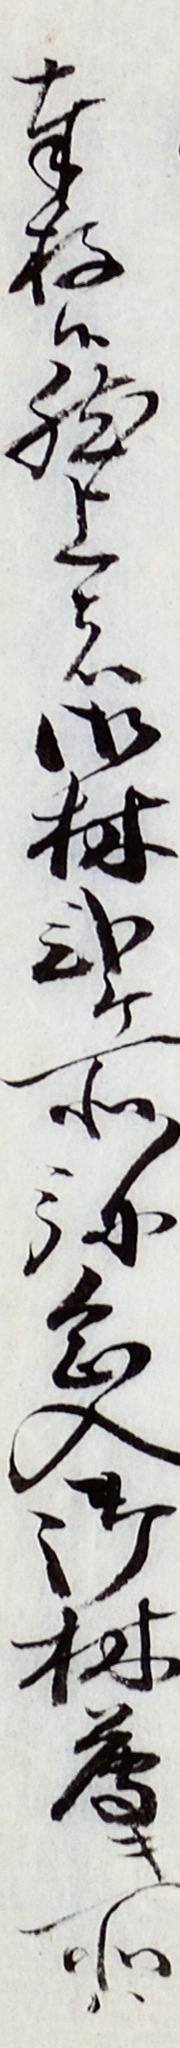奉存候然上者御林弐ヶ所弥念入御林薄キ所ハ
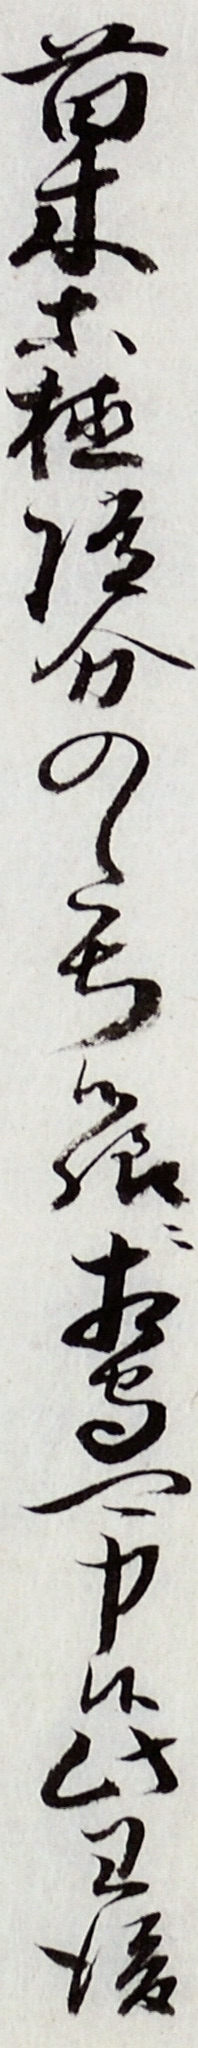苗木等植随分のたち候様ニ相守可申候此已後
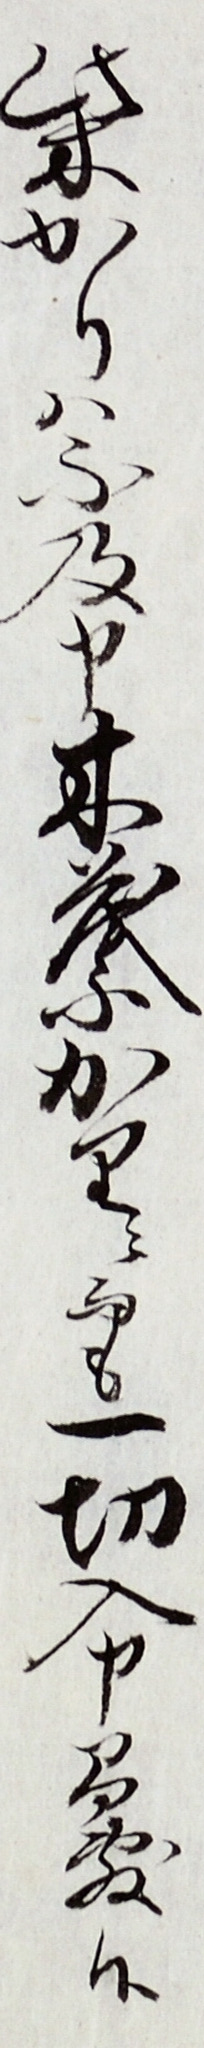柴かりハ不及申来はかりニ而も一切入申間敷候
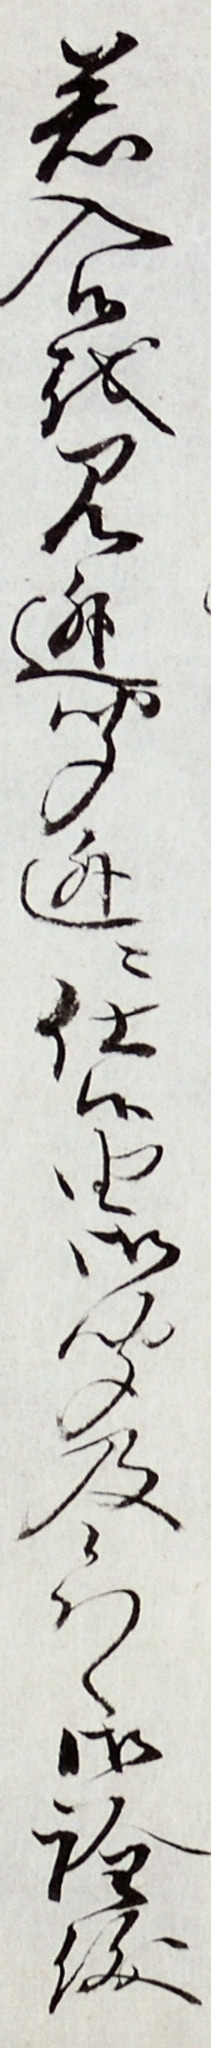若入候を見逃聞逃ニ仕候由御聞及候ハヽ御詮儀
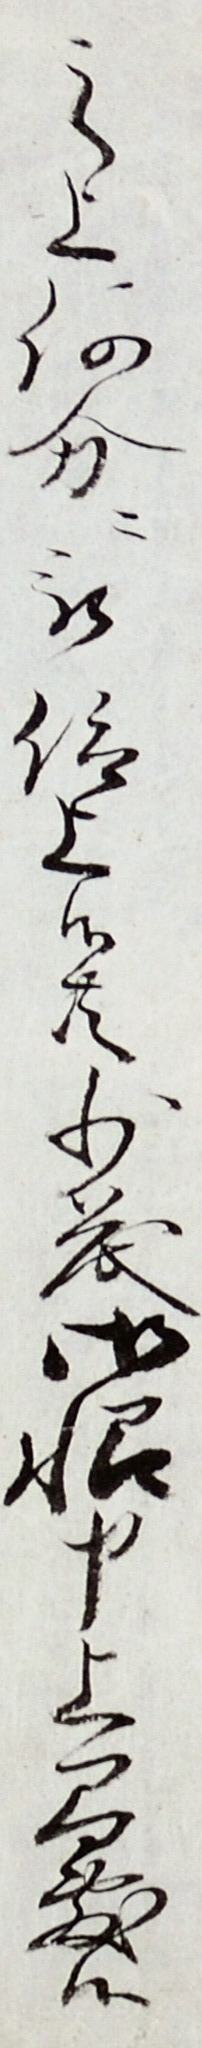之上何分ニ被仰上候共少も御恨申上間敷候
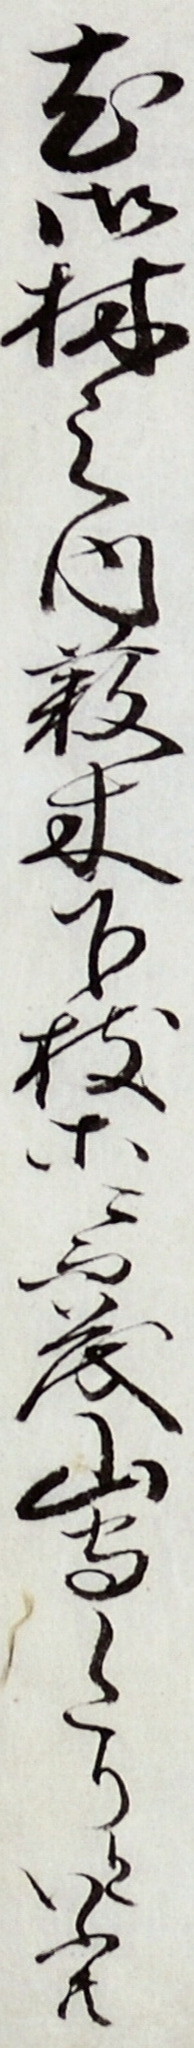尤御林之内薮木枝等ニ而も山守候たりといふ共

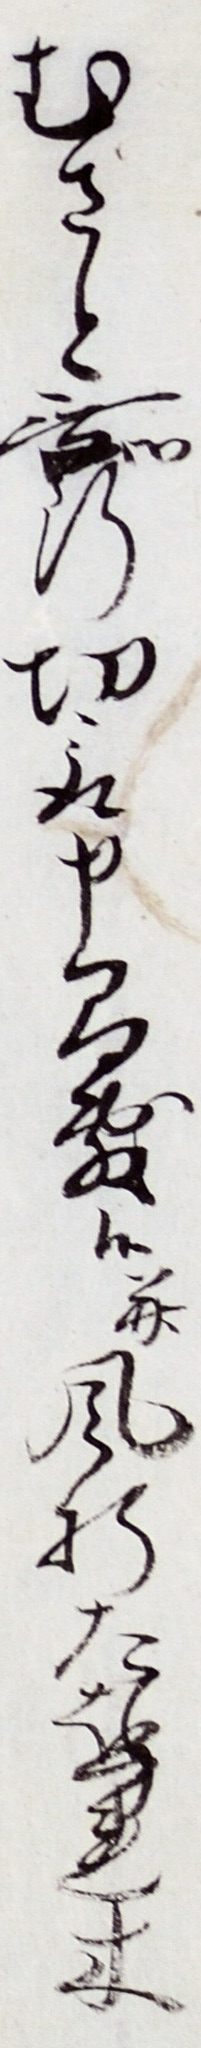むさと無御断切取申間敷候并風折たをれ木
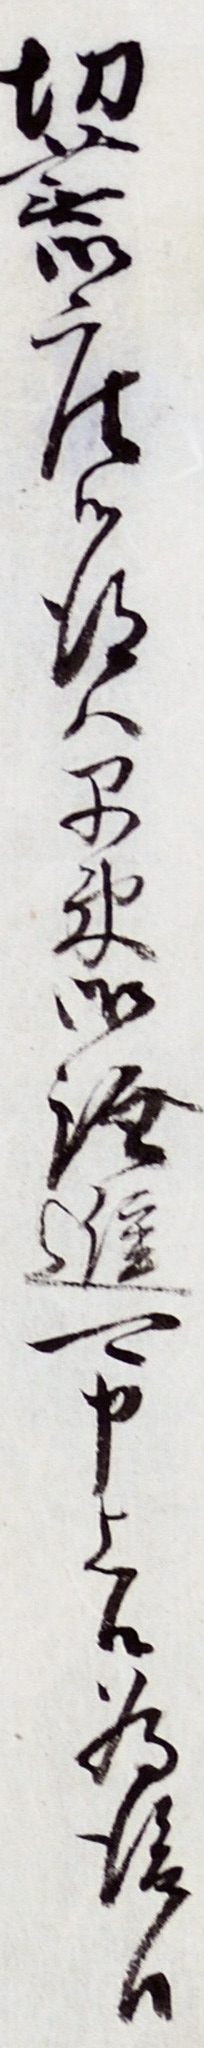切蕪御座候得ハ早束御注進可申上候為後日
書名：御林御竹藪証文控
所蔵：伊那市立高遠町図書館・合同会社AMANE
